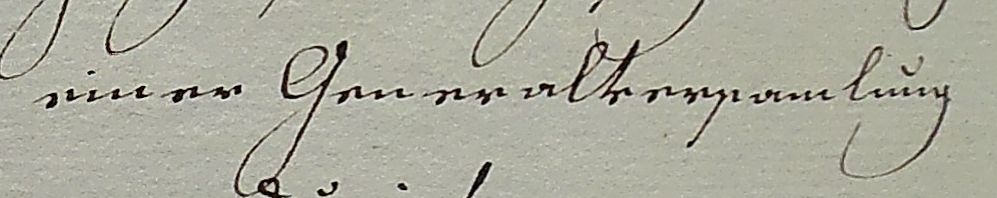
einer Generalversamlung
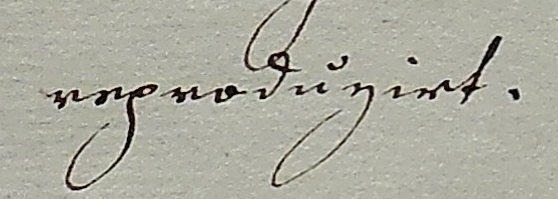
reproduzirt.
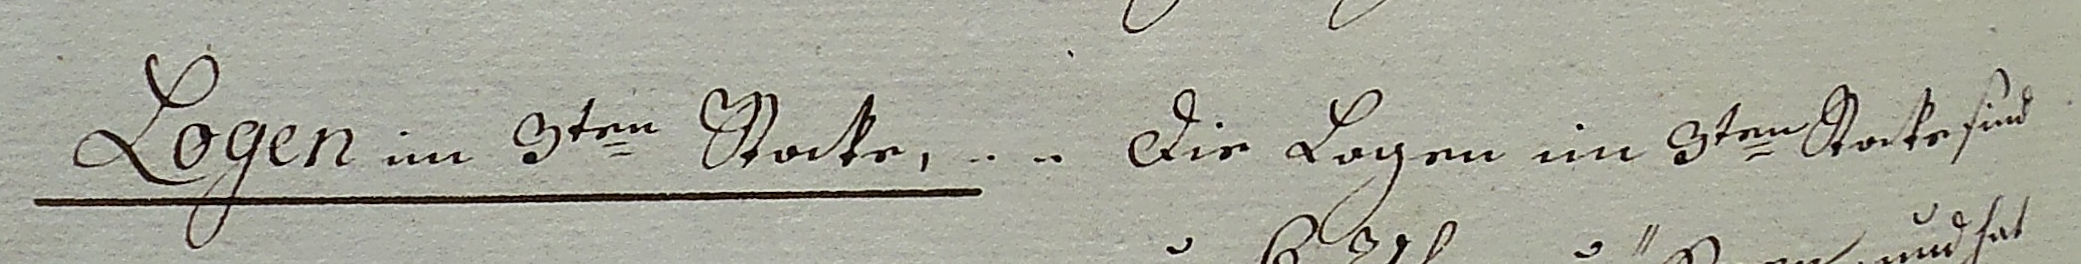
Logen im 3te͇n Stocke, .. .. Die Logen im 3te͇n Stocke sind
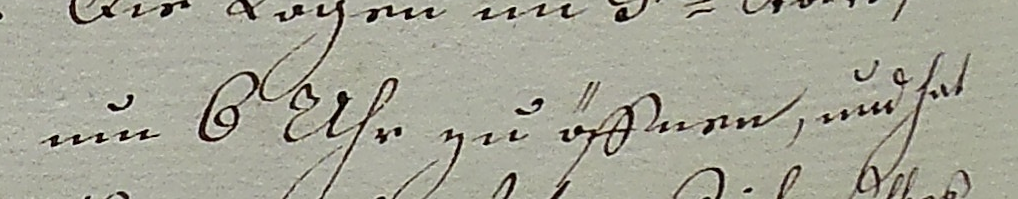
um 6 Uhr zu öffnen, und hat
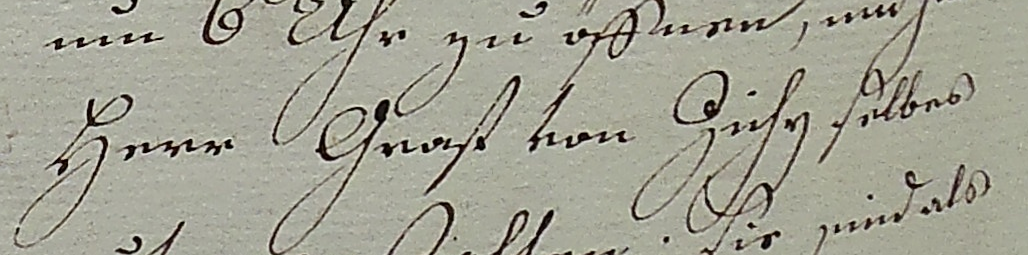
Herr Graf von Zichy selber
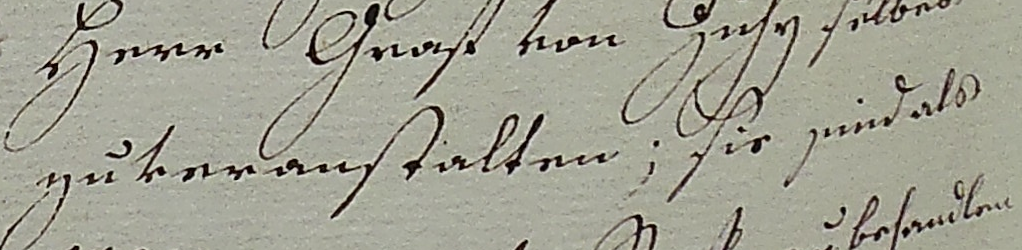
zuveranstalten; sie sind als
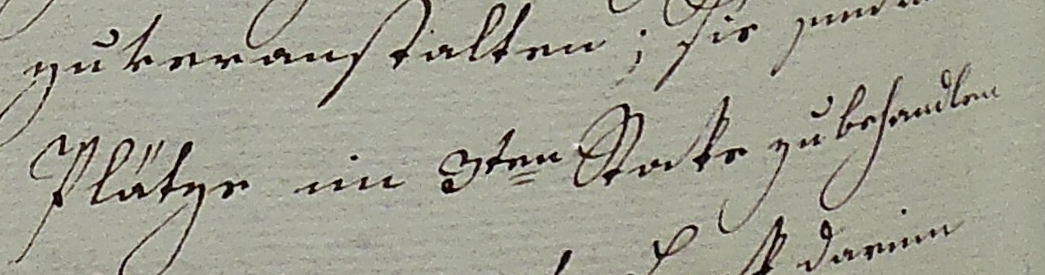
Plätze im 3te͇n Stocke zubehandlen
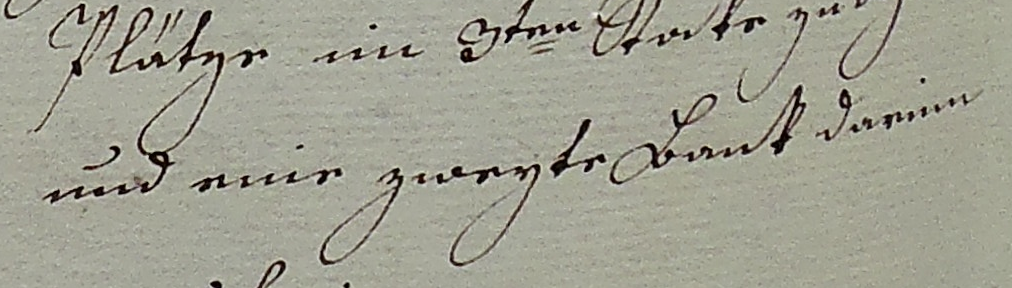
und eine zweyte Bank darinn
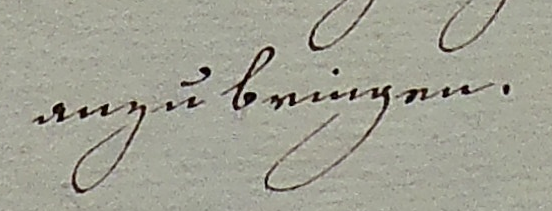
anzubringen.
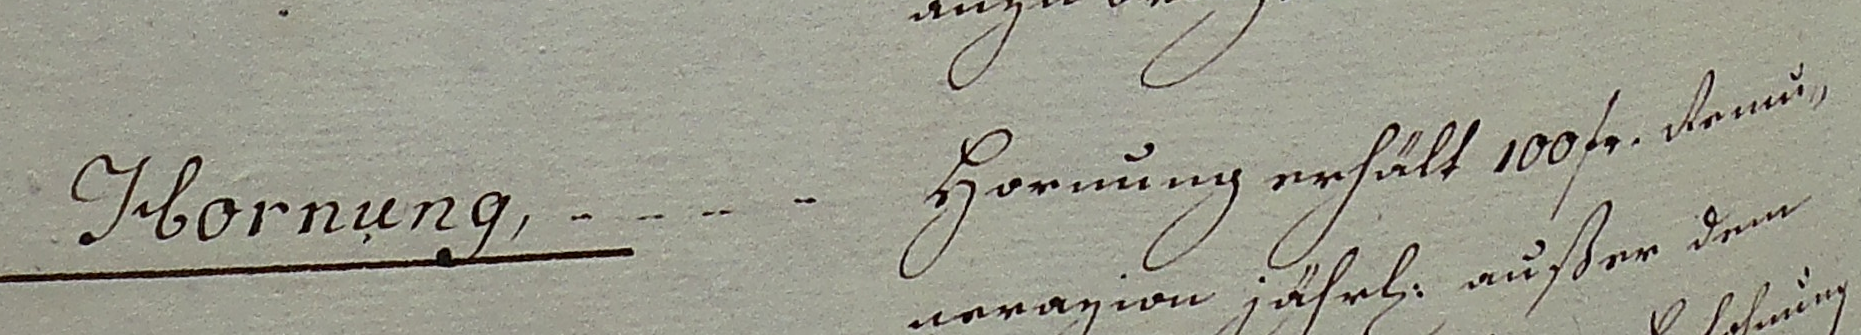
Hornung, .. .. .. .. Hornung erhält 100fr. Remu¬
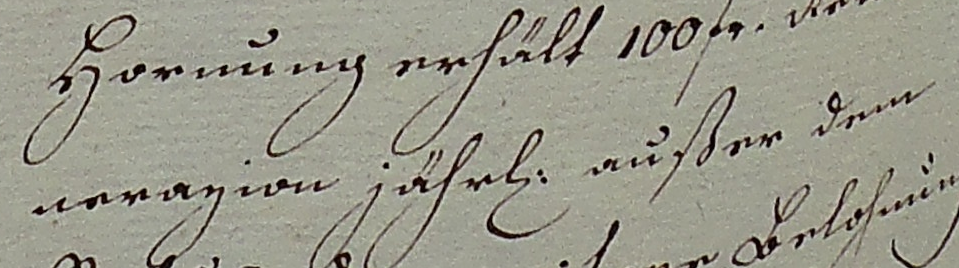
nerazion jährl: außer dem
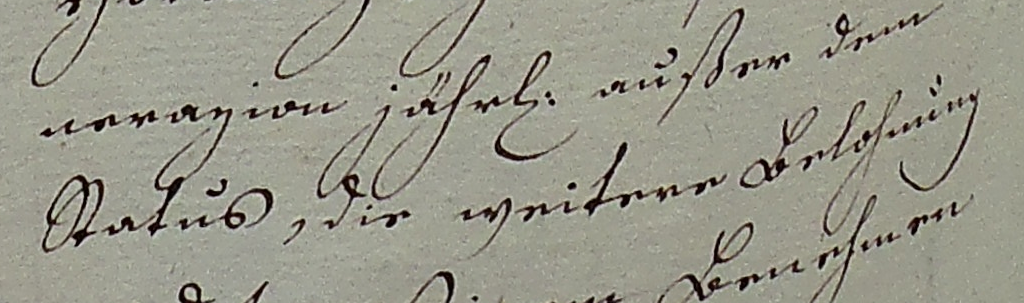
Status, die weitere Belohnung
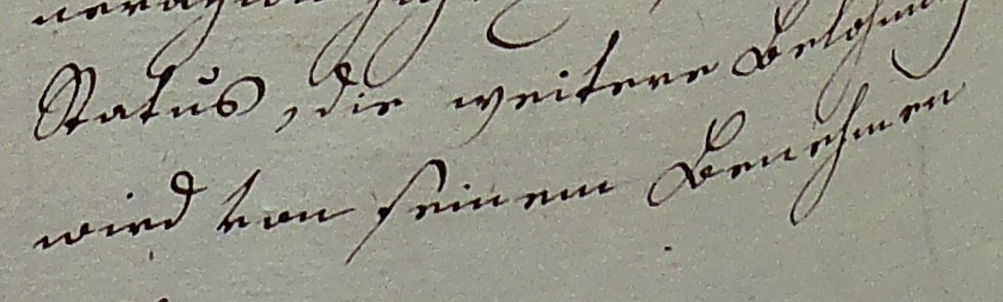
wird von seinem Benehmen
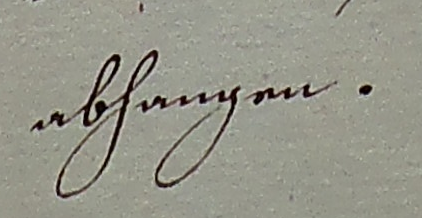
abhangen.
